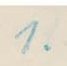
H.
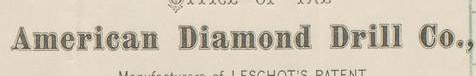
American Diamond Drill Co.,
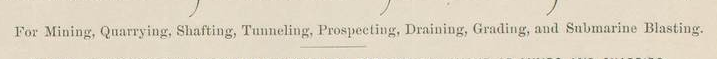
For Mining, Quarrying, Shafting, Tunneling, Prospecting, Draining, Grading, and Submarine Blasting.
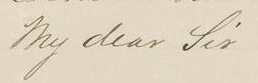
My dear Sir
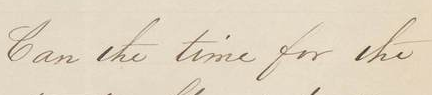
Can the time for the
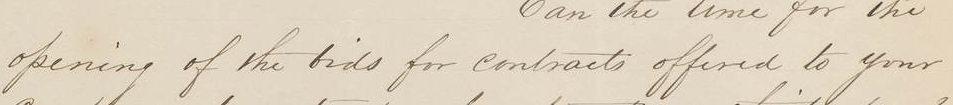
opening of the bids for contracts offered to your
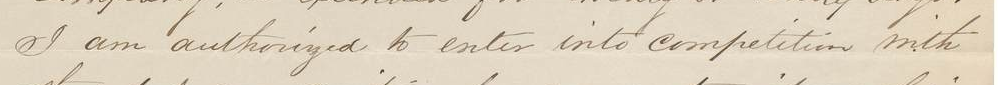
I am authorized to enter into competition with
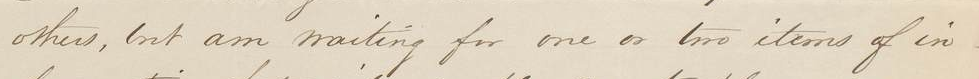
others, but am waiting for one or two items of in-
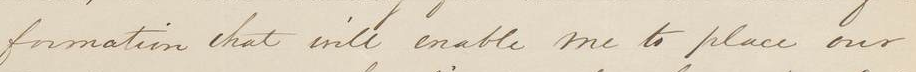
formation that will enable me to place our
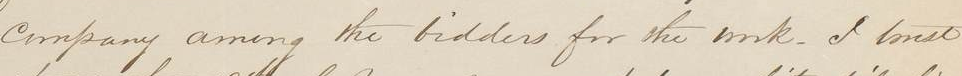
Company among the bidders for the work. I trust
